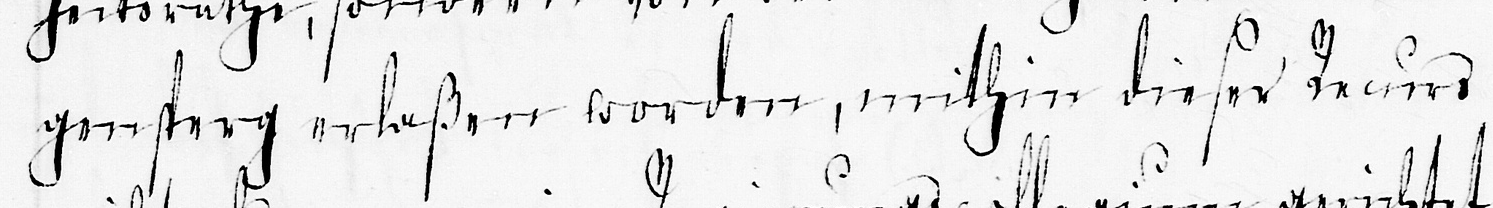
gensperg erlaßen worden, mithin dieser Recurs
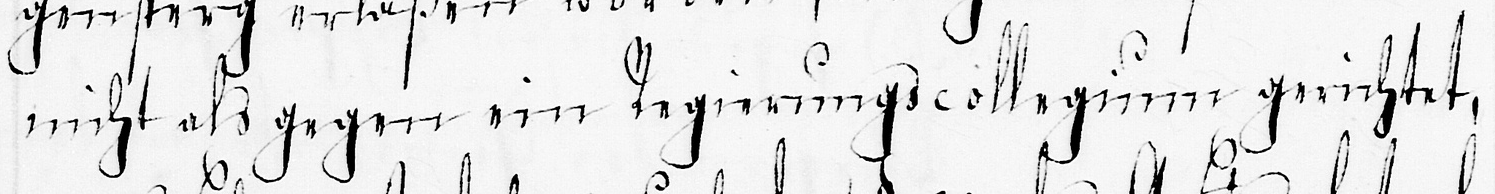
nicht als gegen ein Regierungscollegium gerichtet,
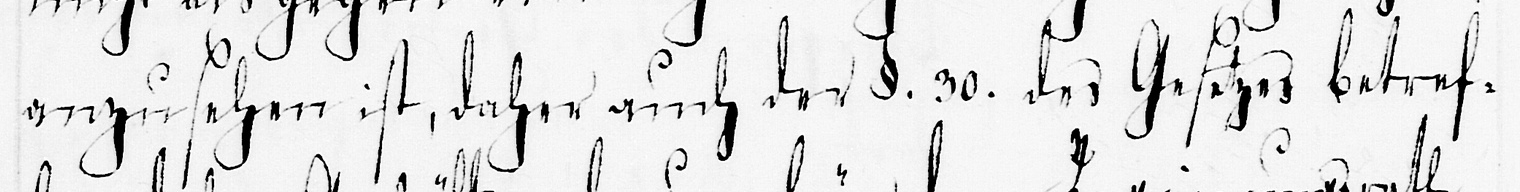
anzusehen ist, daher auch der §. 30. des Gesetzes betref¬
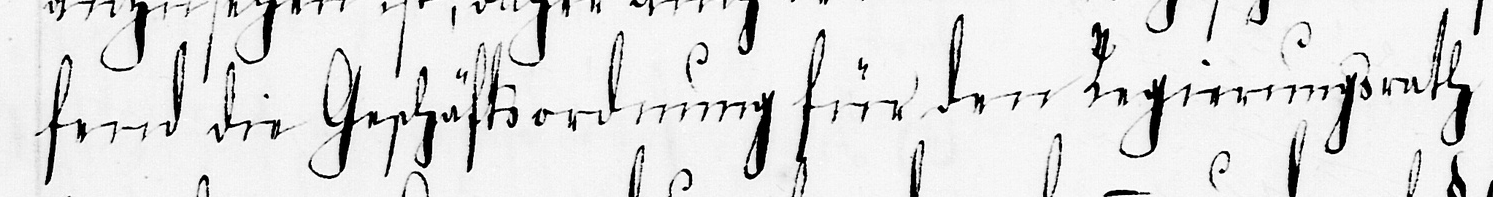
fend die Geschäftsordnung für den Regierungsrath
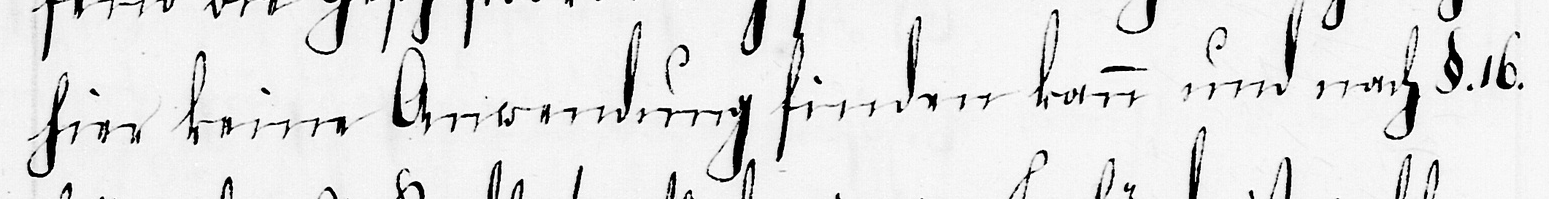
hier keine Anwendung finden kann und nach §. 16.
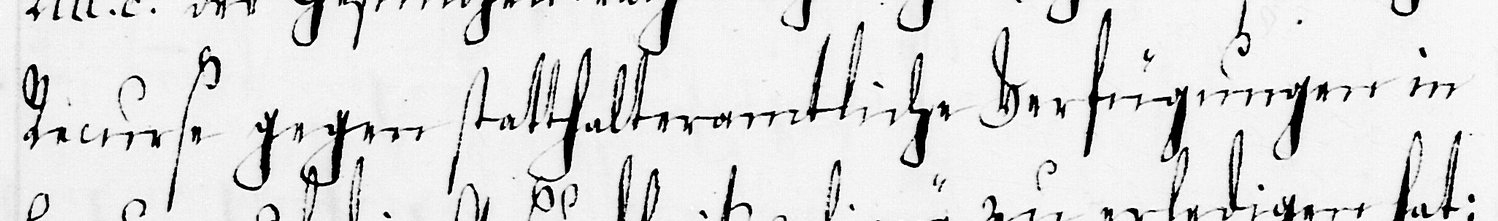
Recurse gegen statthalteramtliche Verfügungen in
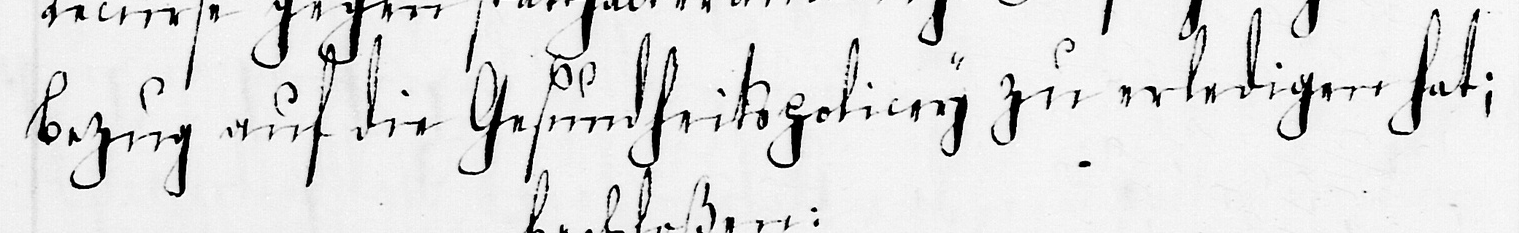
Bezug auf die Gesundheitspolicey zu erledigen hat;
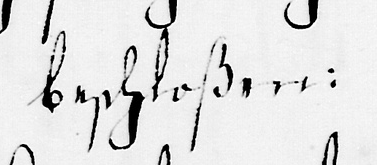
beschloßen:
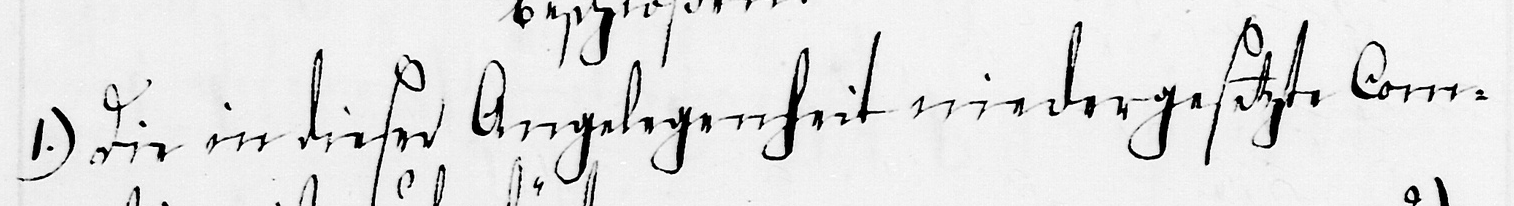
1.) Die in dieser Angelegenheit niedergesetzte Com¬
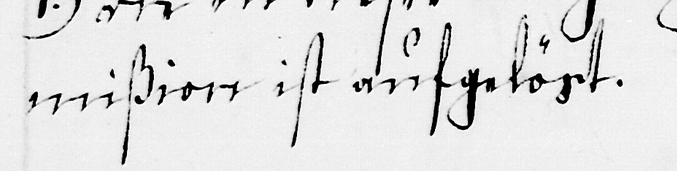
mißion ist aufgelöst.
